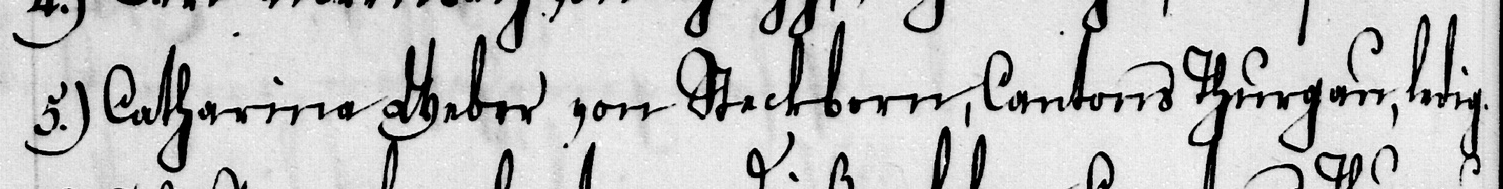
5.) Catharina Weber von Steckborn, Cantons Thurgau, ledi¬
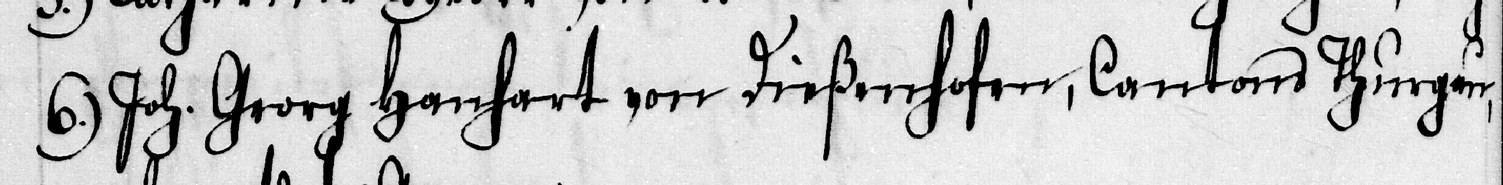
6.) Joh. Georg Hanhart von Dießenhofen, Cantons Thurgau,
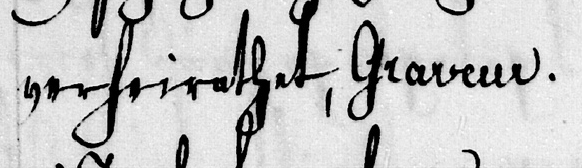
verheirathet, Graveur.
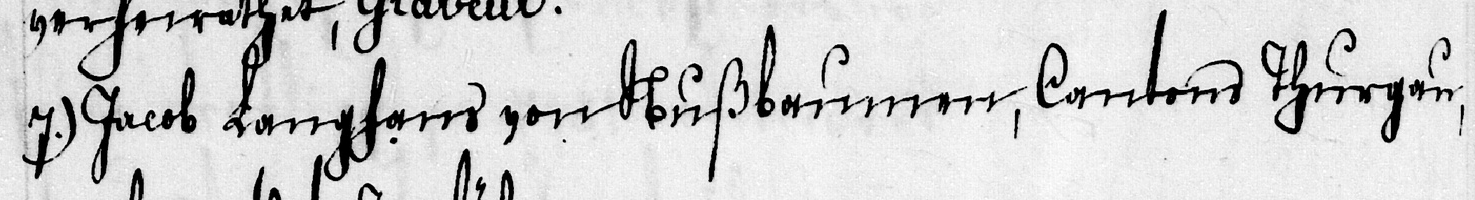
7.) Jacob Langhans von Nußbaumen, Cantons Thurgau,
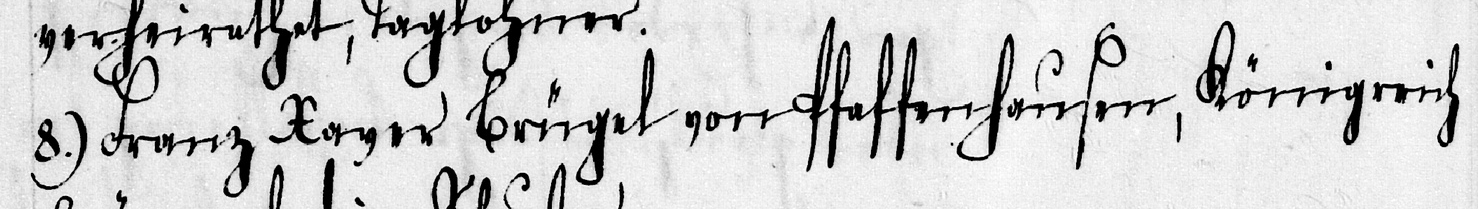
8.) Franz Xaver Brügel von Pfaffenhausen, Königreich
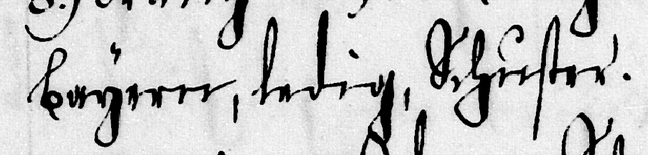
Bayern, ledig, Schuster.
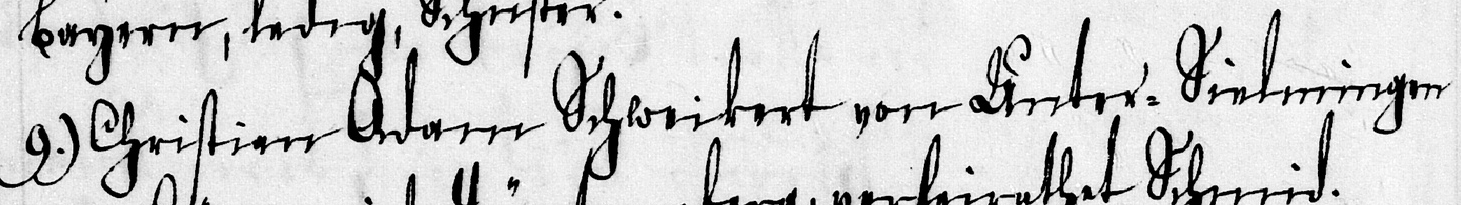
9.) Christian Adam Schweikert von Unter-Sielmingen
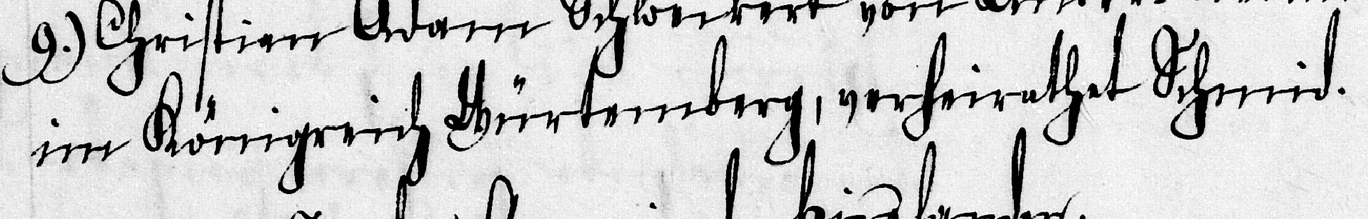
im Königreich Würtemberg, verheirathet Schmid.
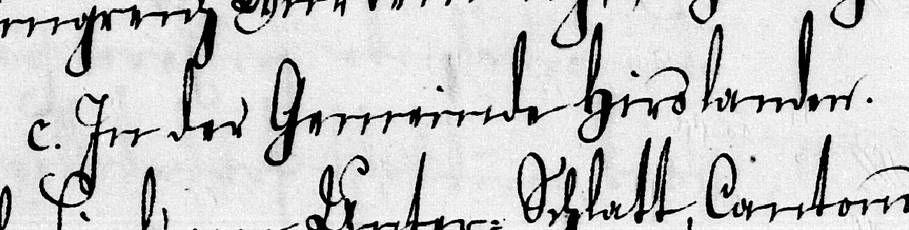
c. In der Gemeinde Hirslanden.
